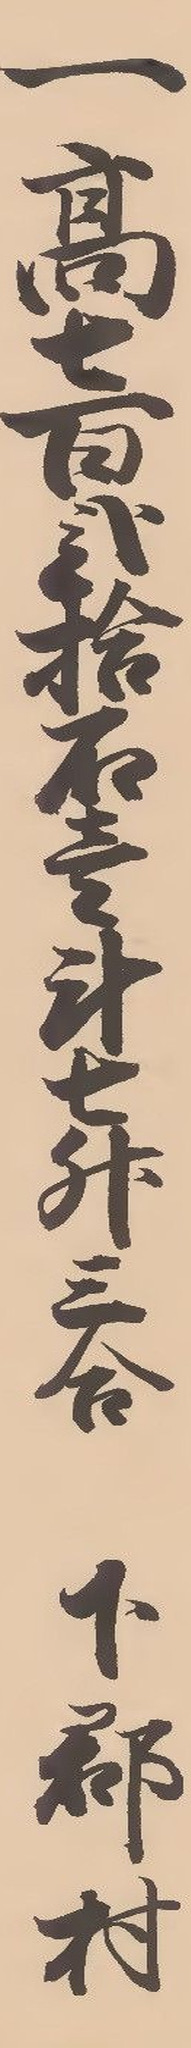一高七百弐拾石壱斗七升三合下郡村
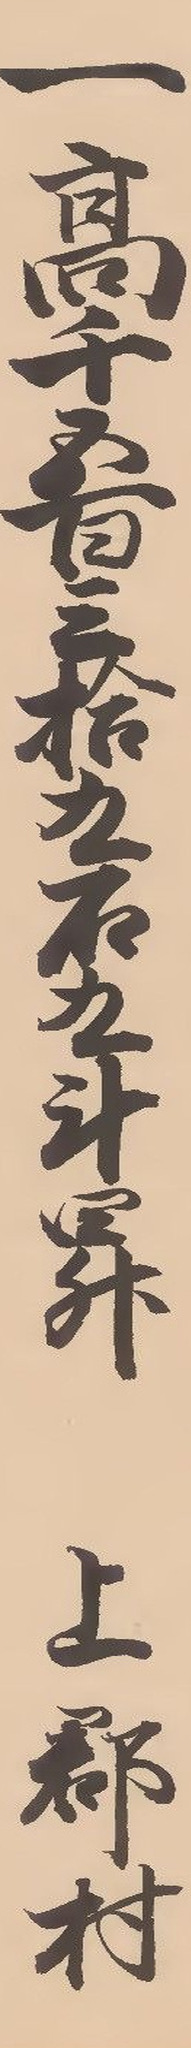一高千五百三拾九石九斗四升上郡村
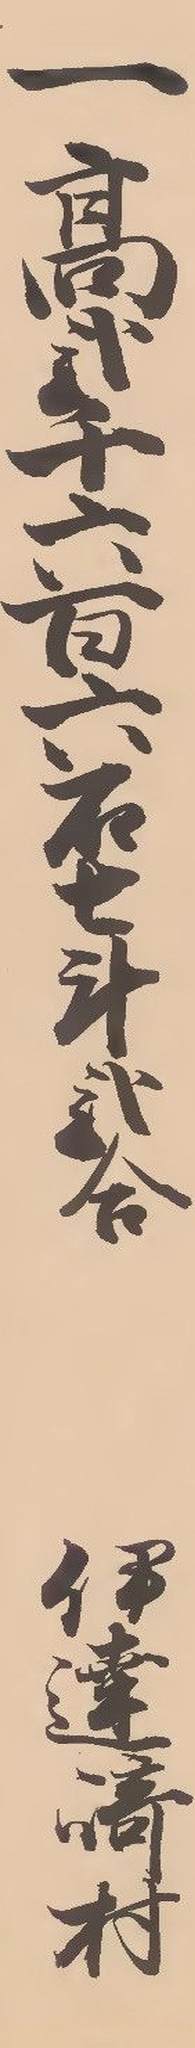一高弐千六百六石七斗弐合伊達崎村
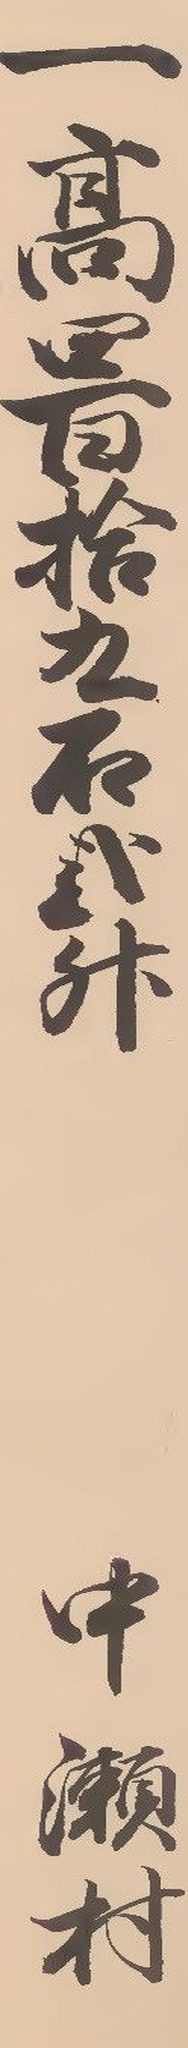一高四百拾九石弐升中瀬村
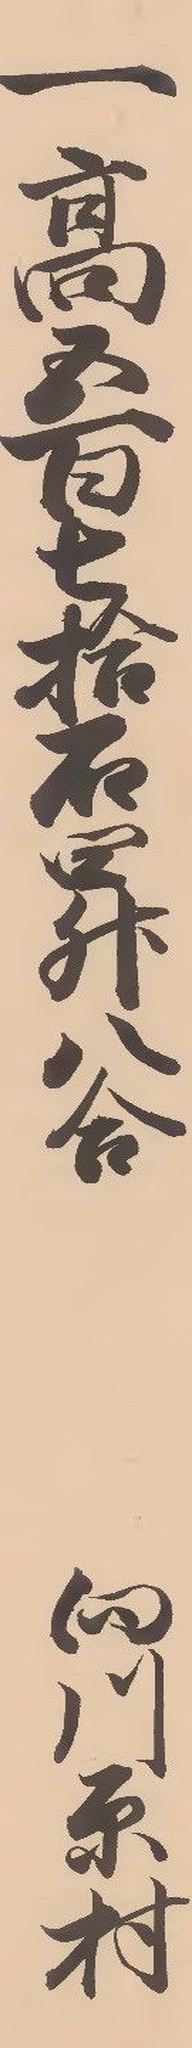一高五百七拾石四升八合向川原村
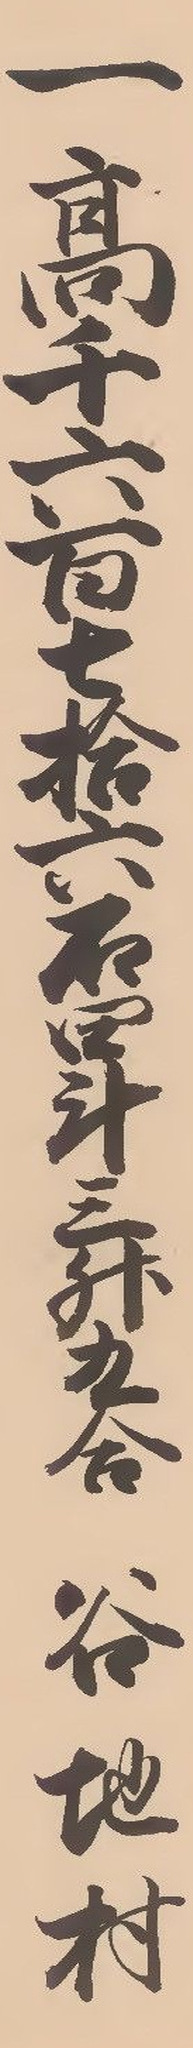一高千六百七拾六石四斗三升九合谷地村
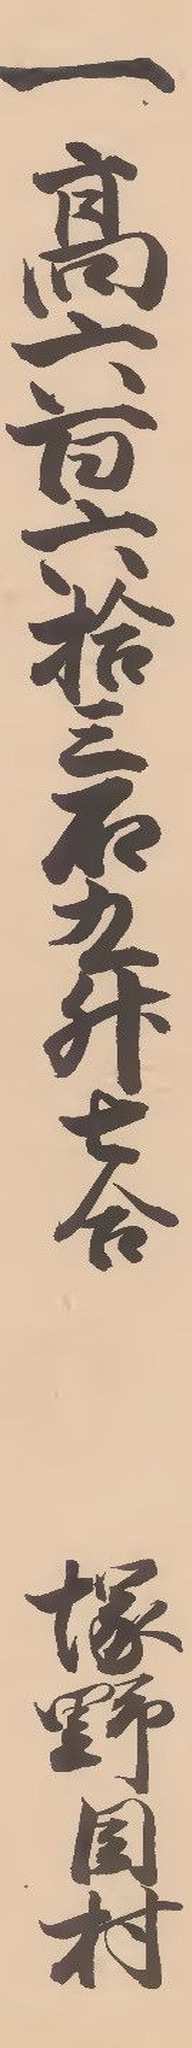一高六百六拾三石九升七合塚野目村

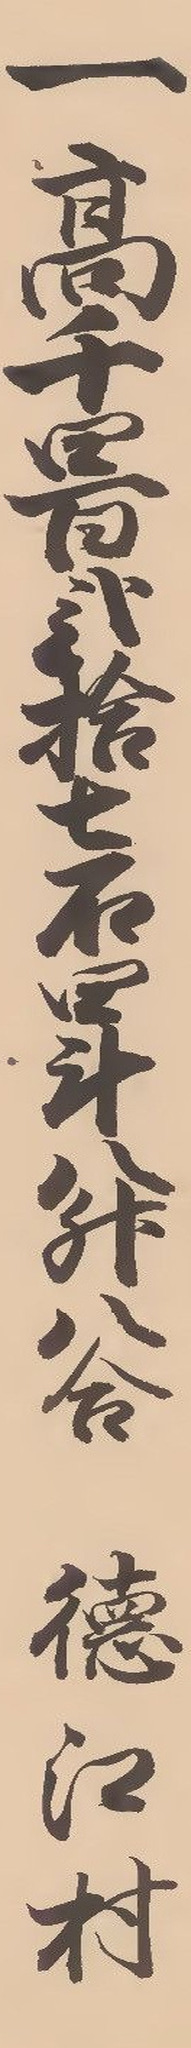一高千四百弐拾七石四斗八升八合徳江村
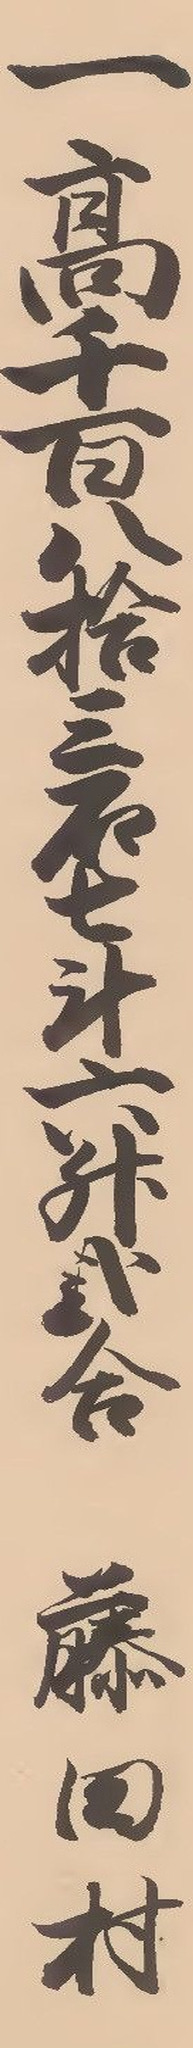一高千百八拾三石七斗六升弐合藤田村
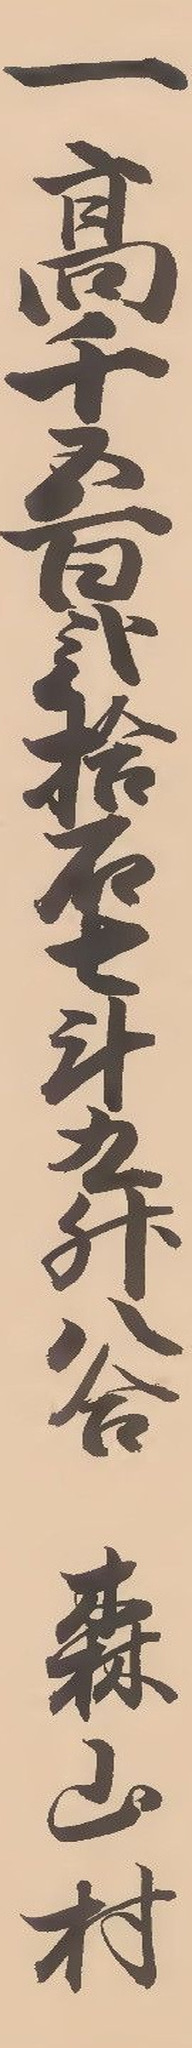一高千五百弐拾石七斗九升八合森山村
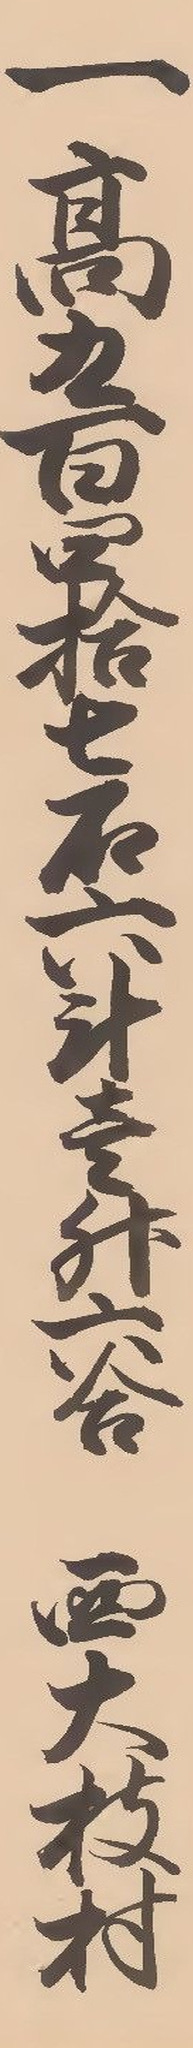一高九百四拾七石六斗壱升六合西大枝村
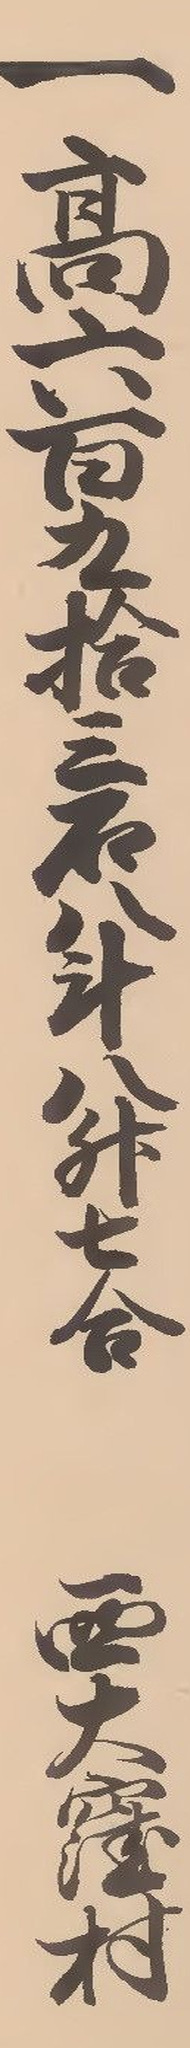一高六百九拾三石八斗八升七合西大窪村
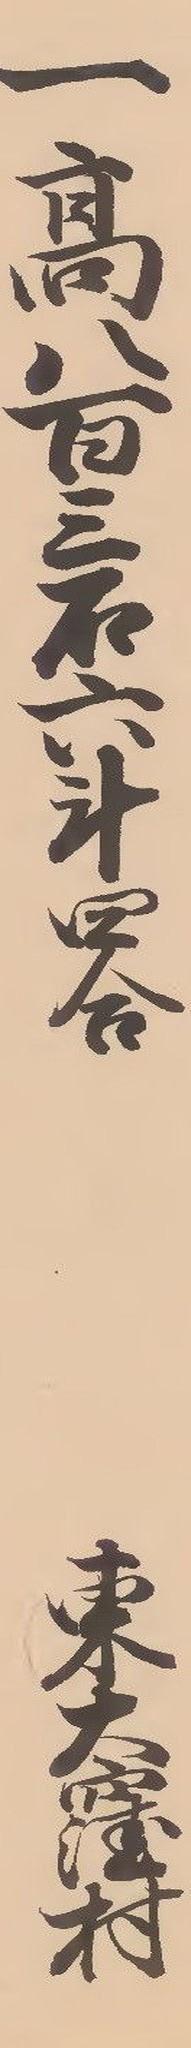一高八百三石六斗四合東大窪村
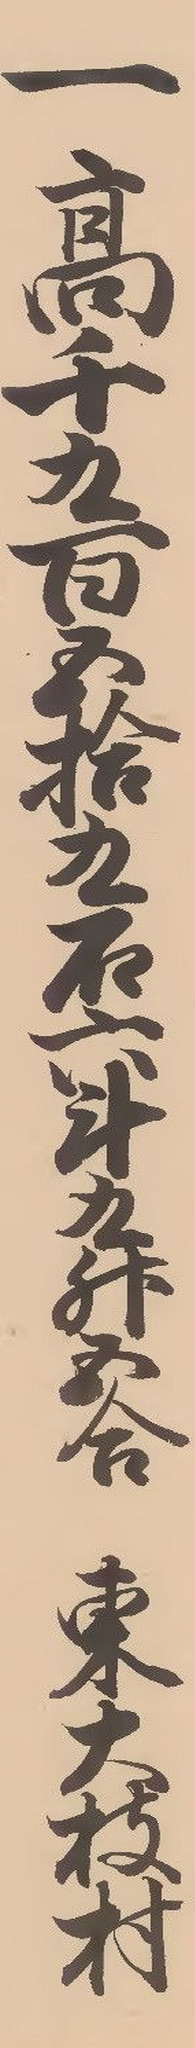一高千九百五拾九石六斗九升五合東大枝村
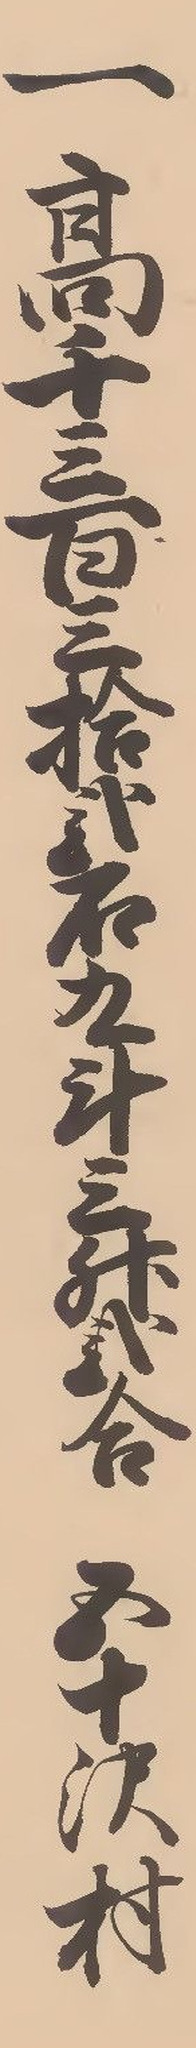一高千三百三拾弐石九斗三升弐合五十沢村

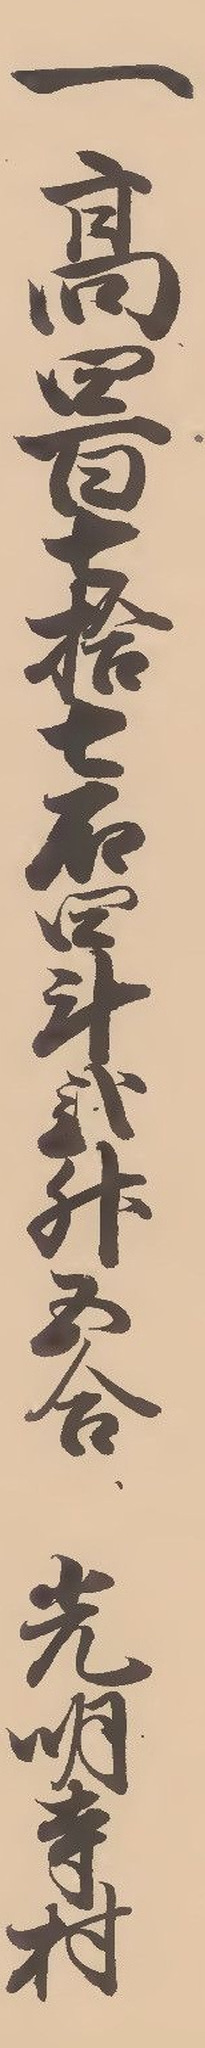一高四百七拾七石四斗弐升五合光明寺村
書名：陸奥国郷帳　４
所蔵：国立公文書館 National Archives of Japan
